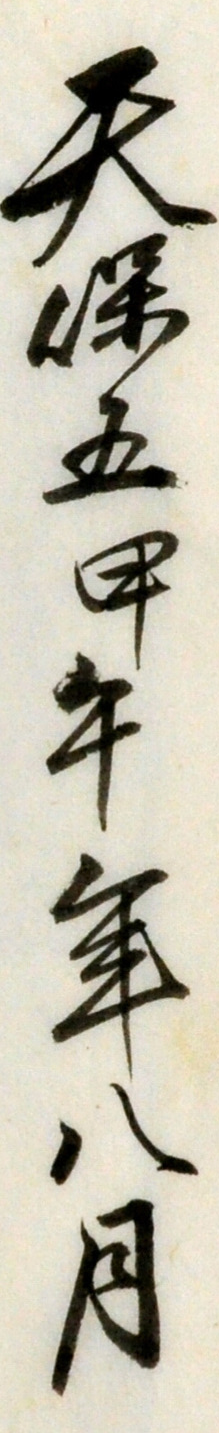天保五甲年八月
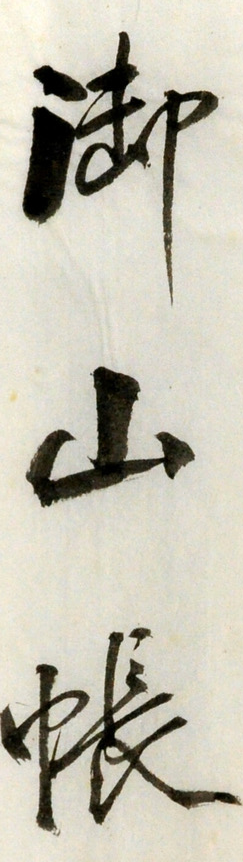御山帳

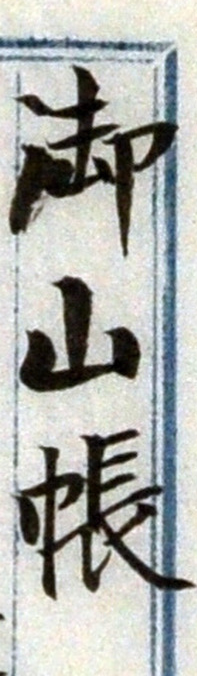御山帳
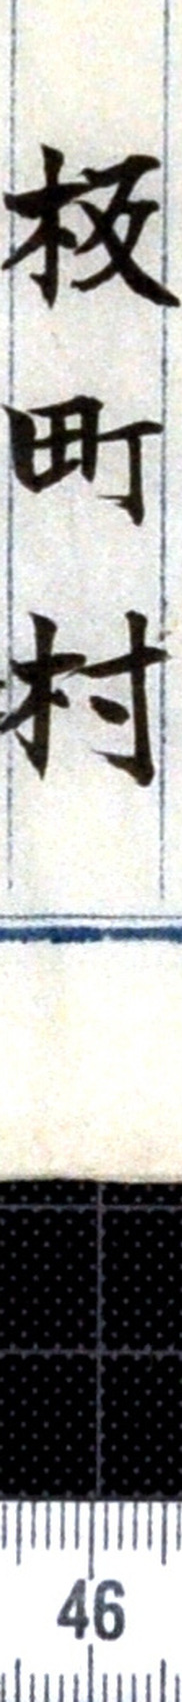板町村
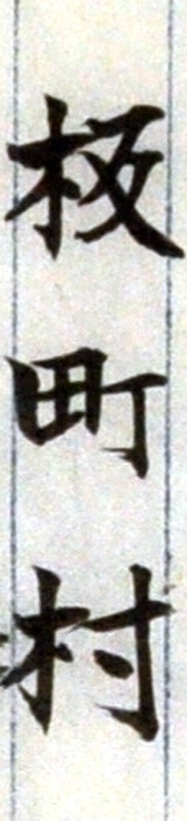板町村
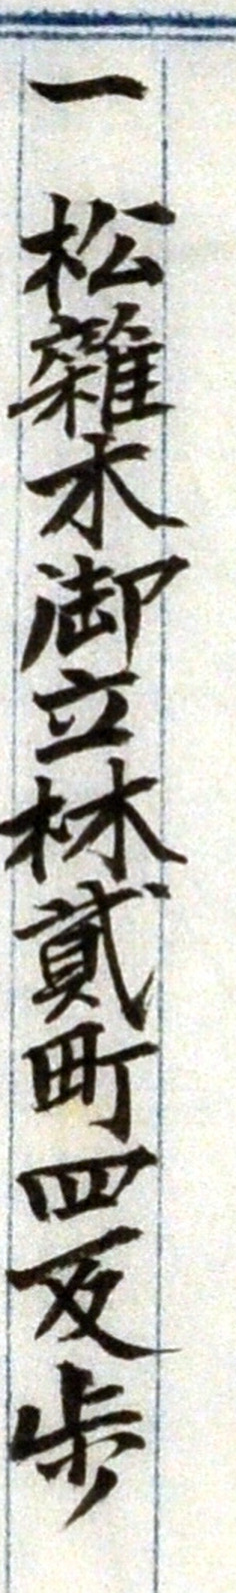一松雑木御立林弐町四反歩壱ヶ所
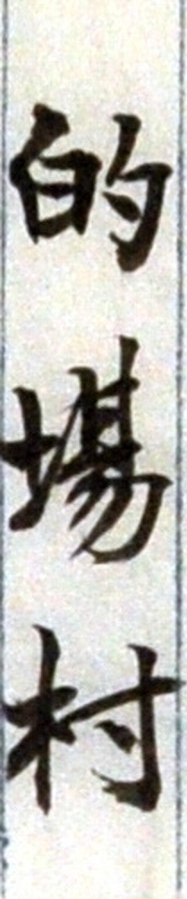的場村
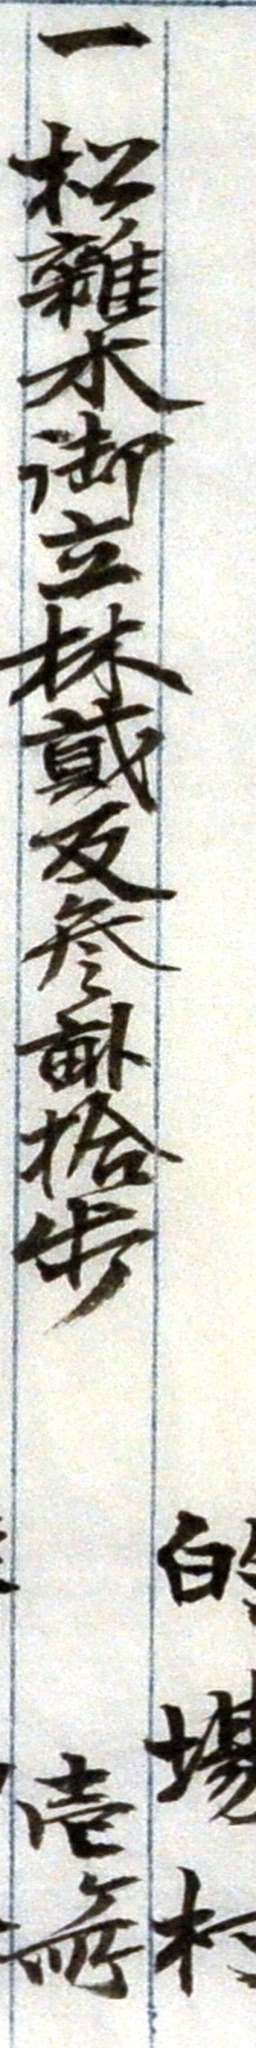一松雑木御立林弐反三畝十歩壱ヶ所
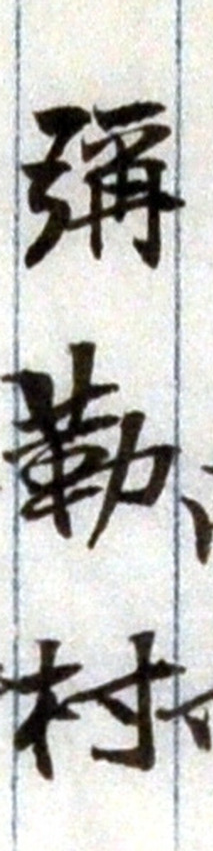弥勒村
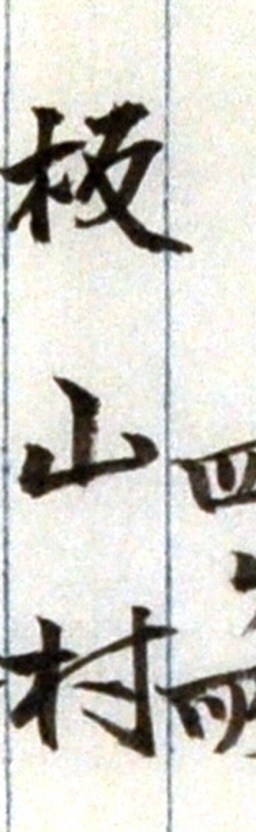板町村
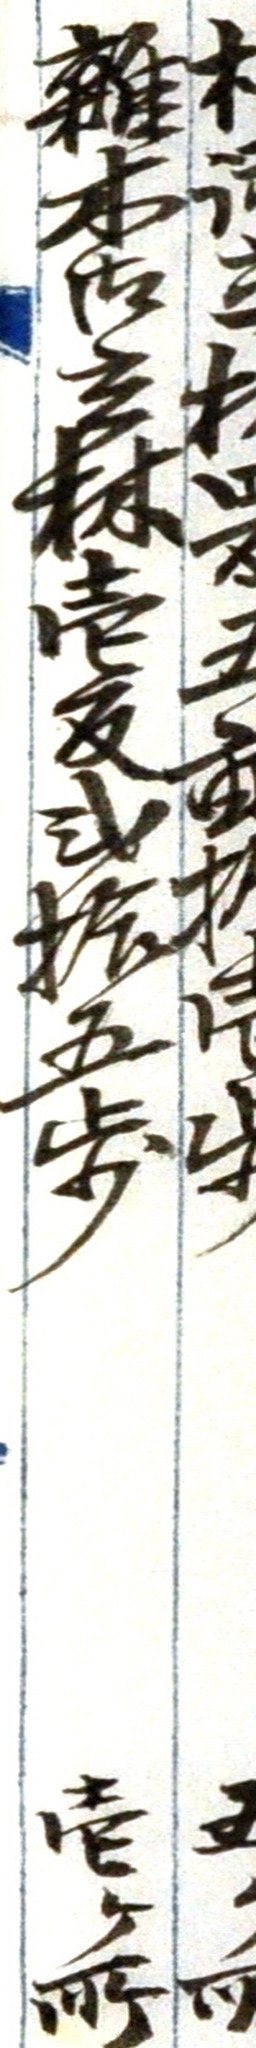一松雑木御立林弐反三畝十歩壱ヶ所

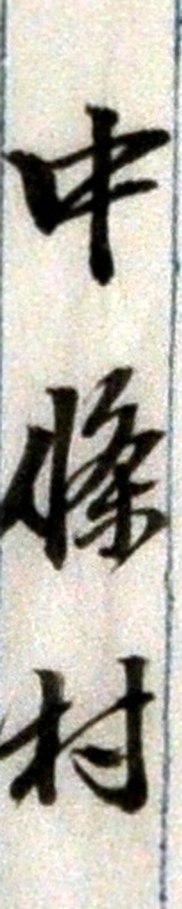中條村
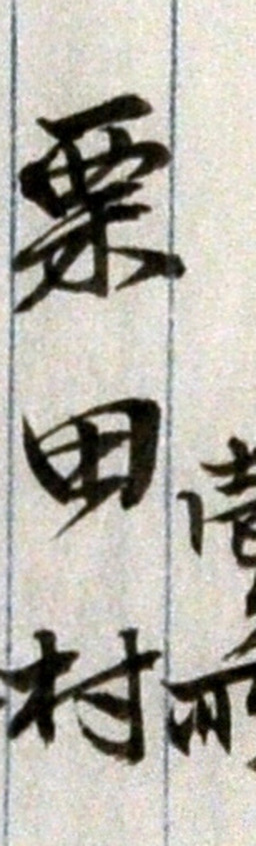栗田村
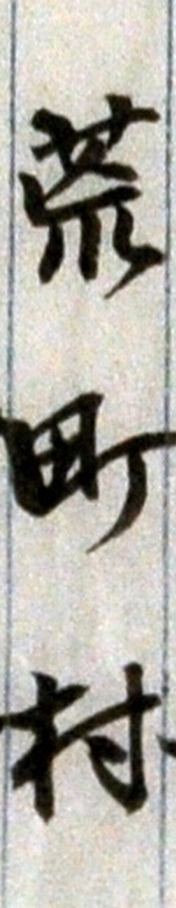荒町村
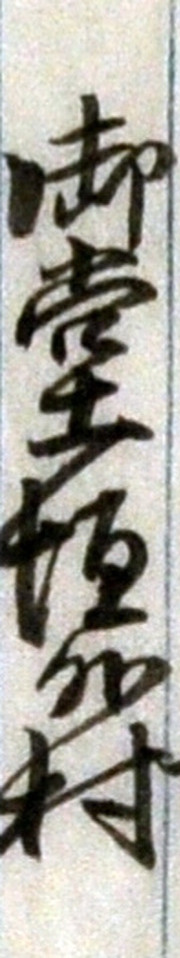御堂垣外村
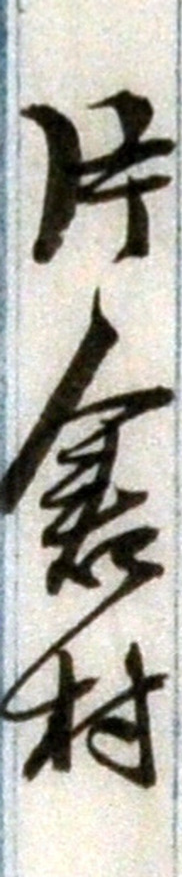片倉村
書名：御山帳
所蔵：伊那市立高遠町図書館・合同会社AMANE
